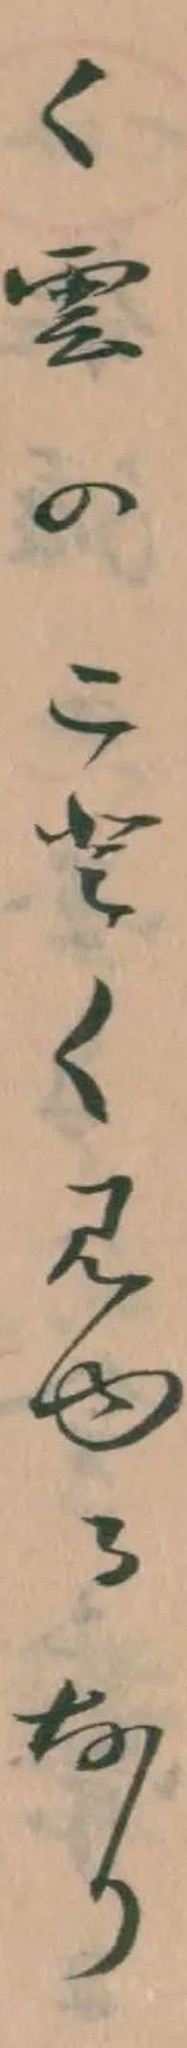く雲のことく見ゆるなり
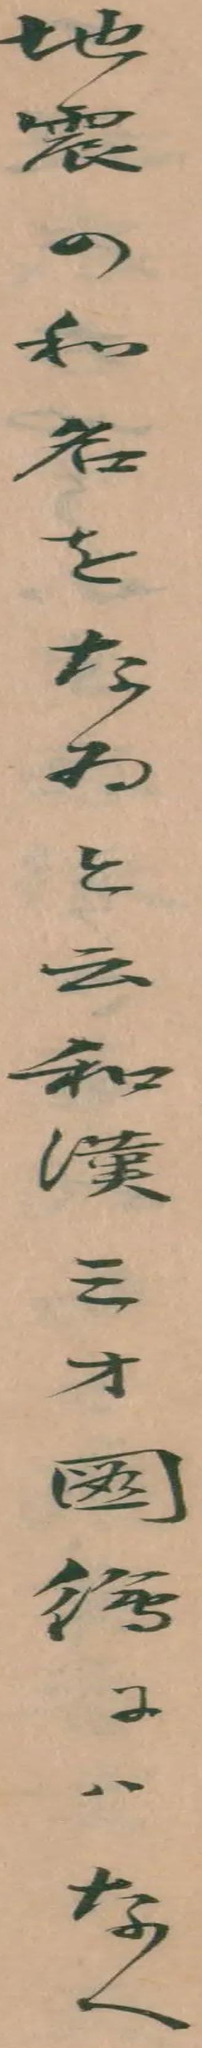地震の和名をなゐと云和漢三才図絵にはなへ
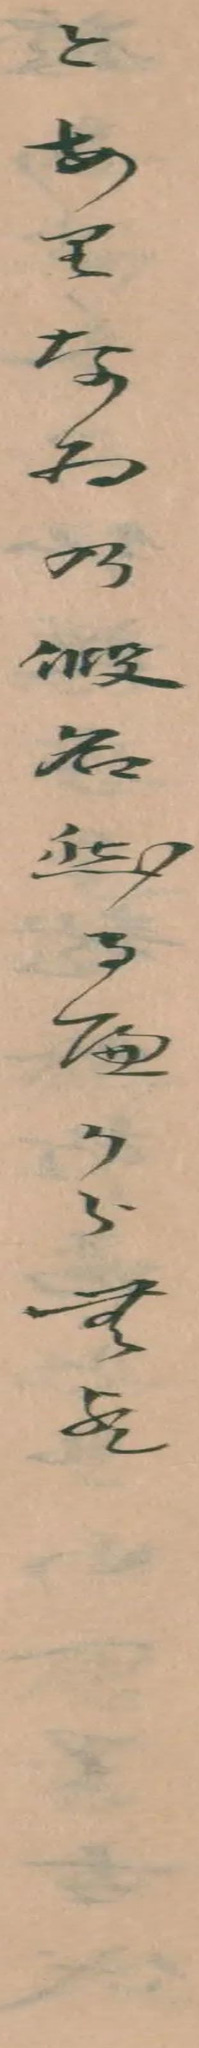とありなゐの仮名然るへからむか
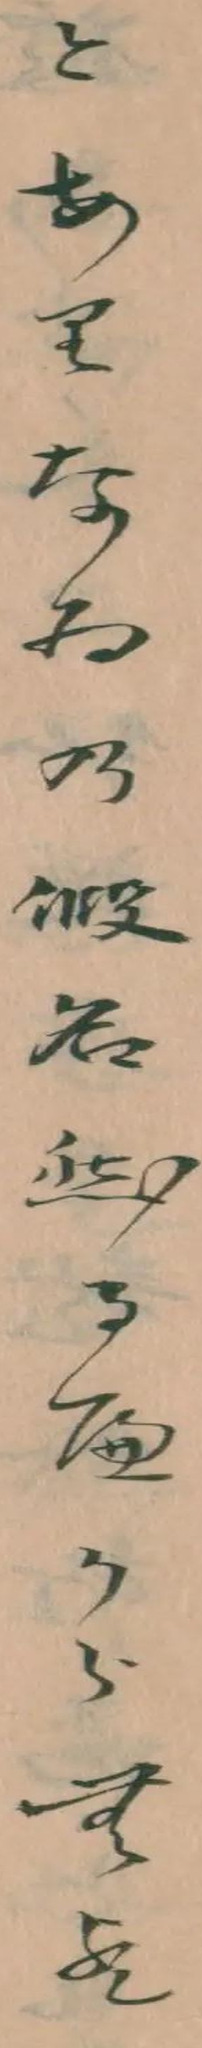とありなゐの仮名然るへからむか
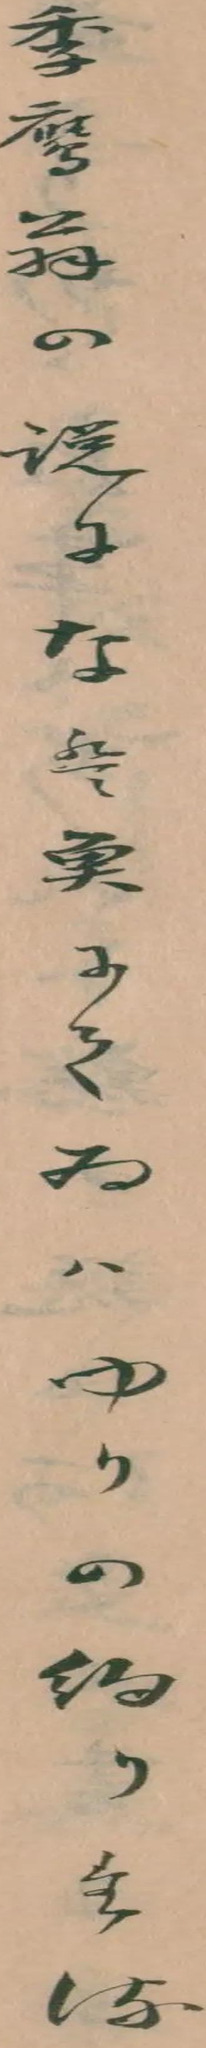季鷹翁の説になは魚にてゐはゆりの約りたる
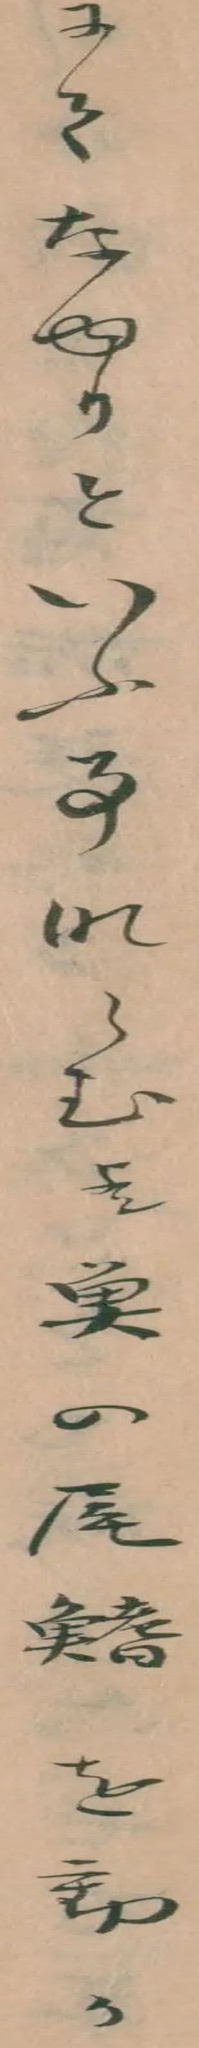にてなゆりといふ事ならむか魚の尾鰭を動か
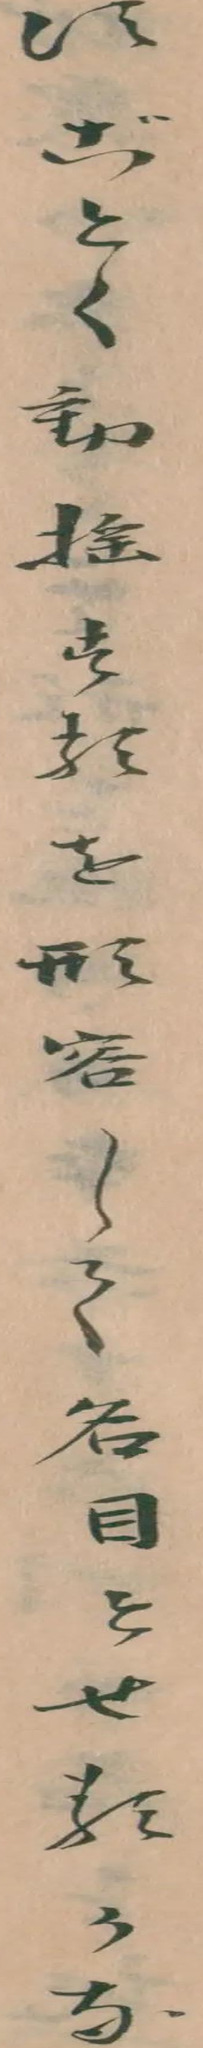すごとく動揺するを形容して名目とせるかな
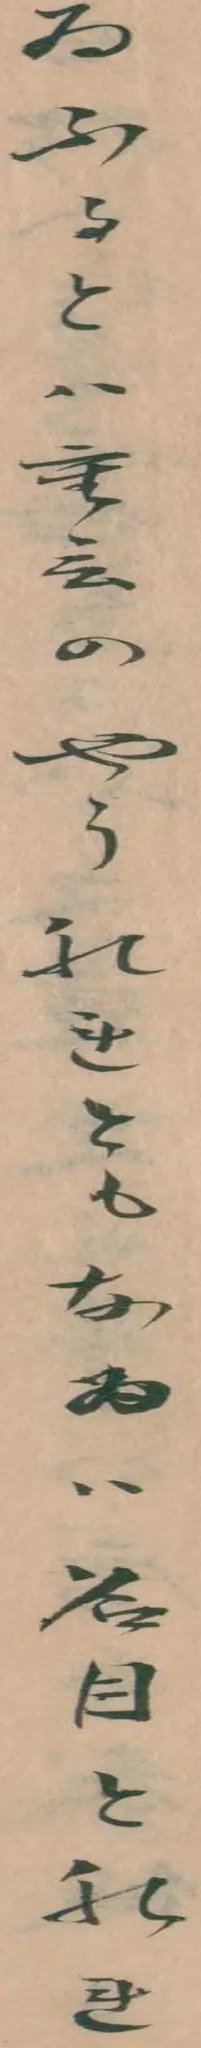ゐふるとは重言のやうなれともなゐは名目となれ
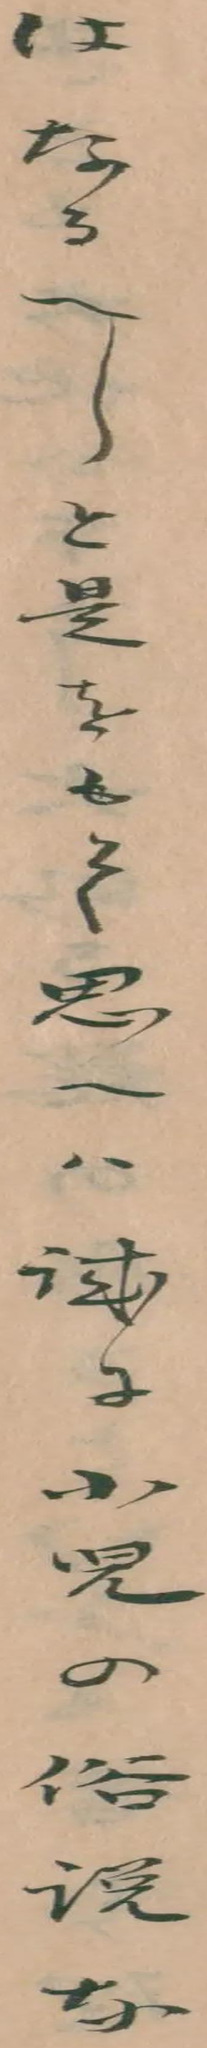はなるへしと是をもて思へは誠に小児の俗説な

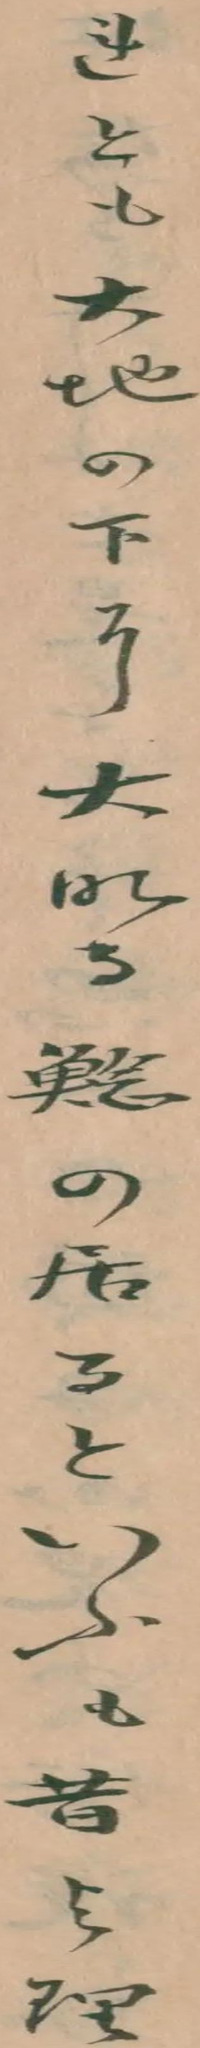れとも大地の下に大なる鯰の居るといふも昔より
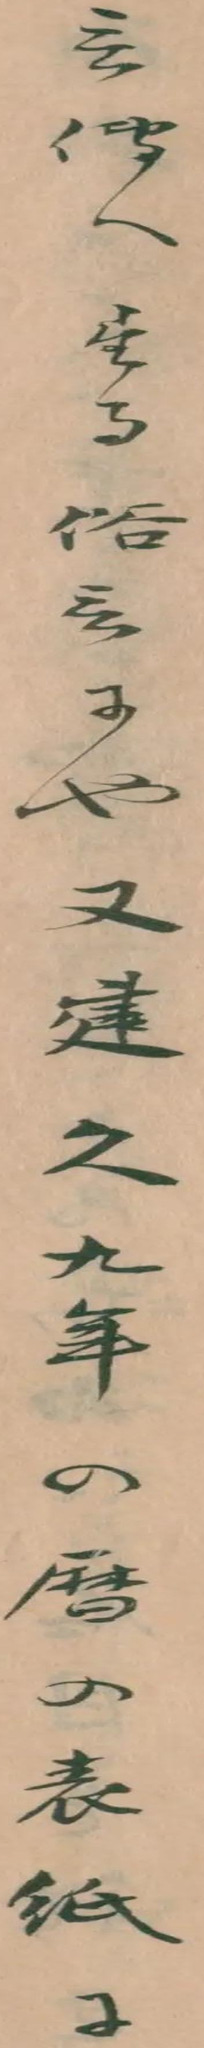言伝へする俗言にや又建久九年の暦の表紙に
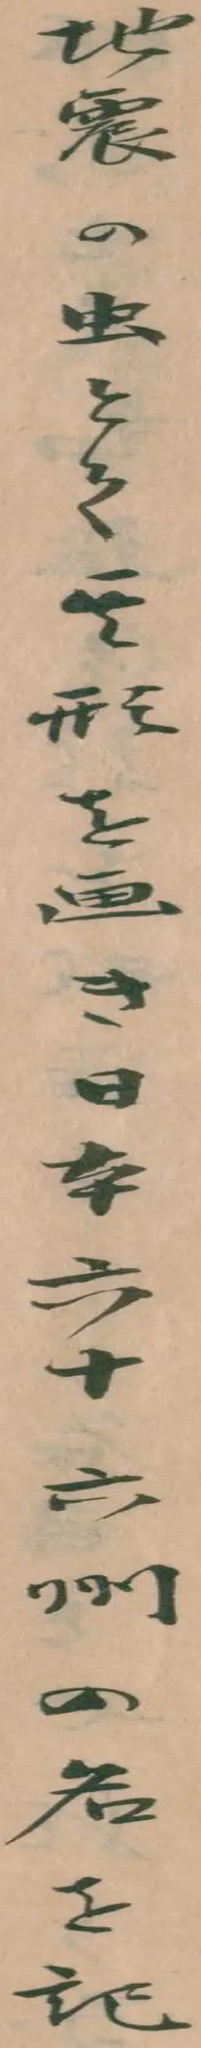地震の虫とて其形を画き日本六十六州の名を記
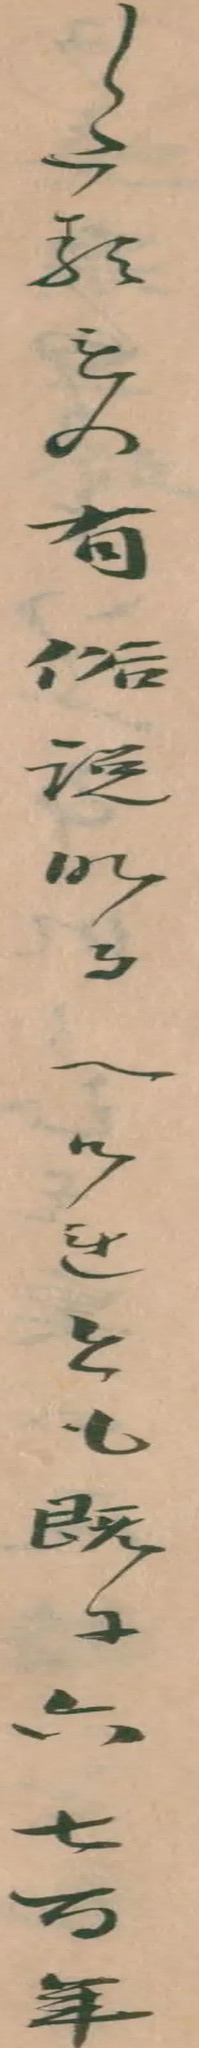したるもの有俗説なるへけれとも既に六七百年
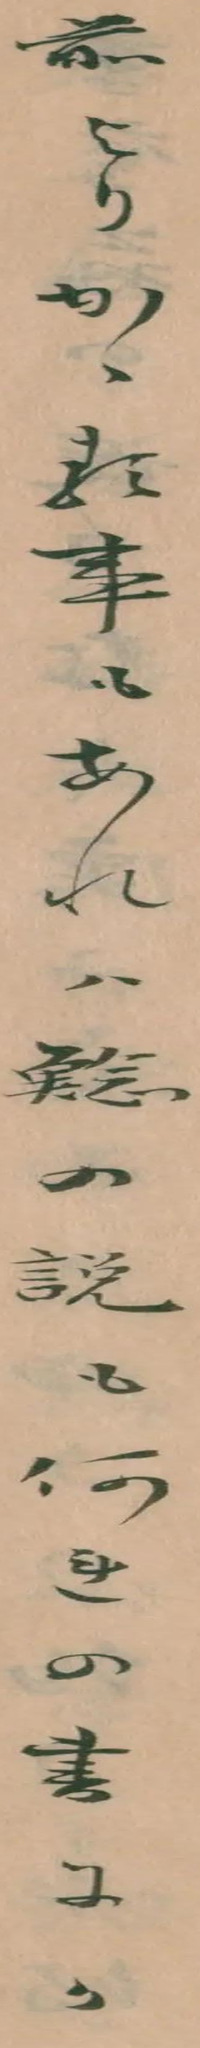前よりかゝる事もあれは鯰の説も何れの書にか
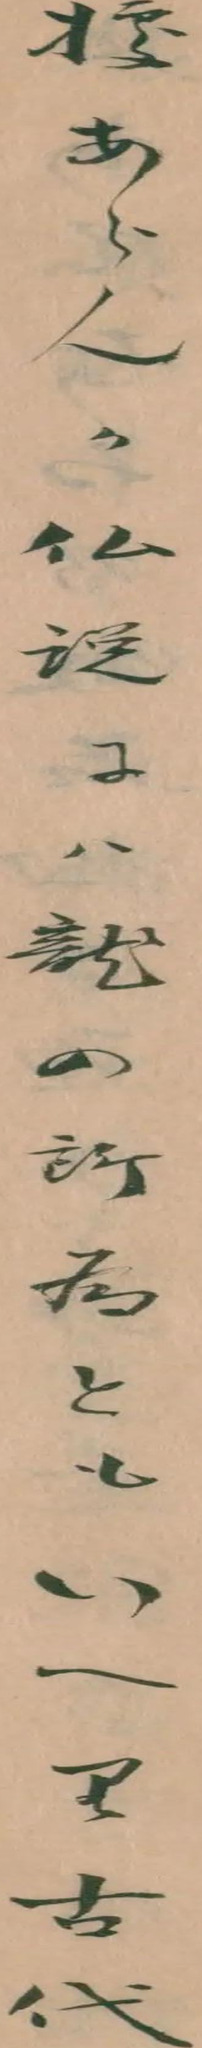拠あらんか仏説には龍の所為ともいへり古代
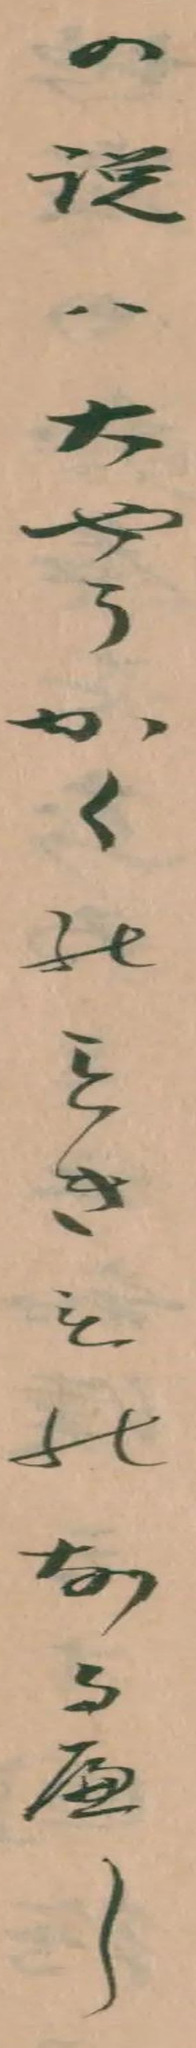の説は大やうかくのこときものなるへし
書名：地災撮要. 巻5-6(地震之部)
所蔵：国立国会図書館 National Diet Library, JAPAN
